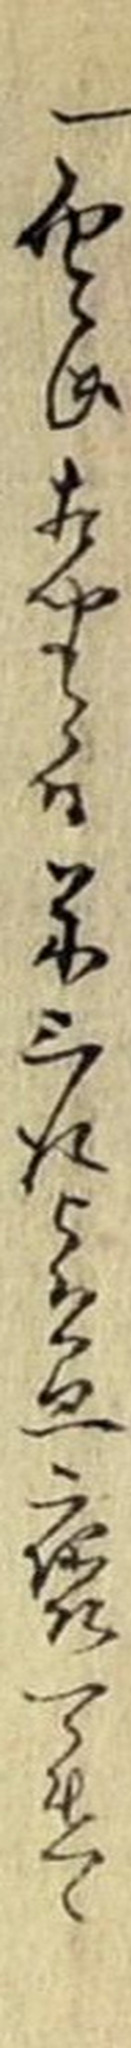届候趣相聞候に付米三俵被下置褒可遣候
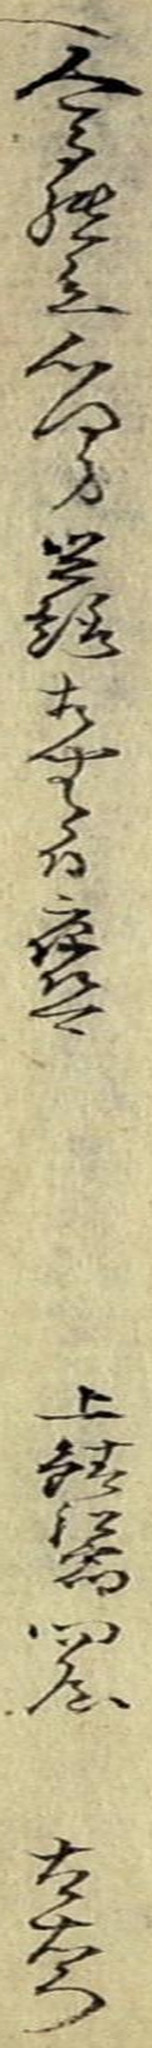人馬継立心得方宜趣相聞候に付褒可上鯖江宿問屋
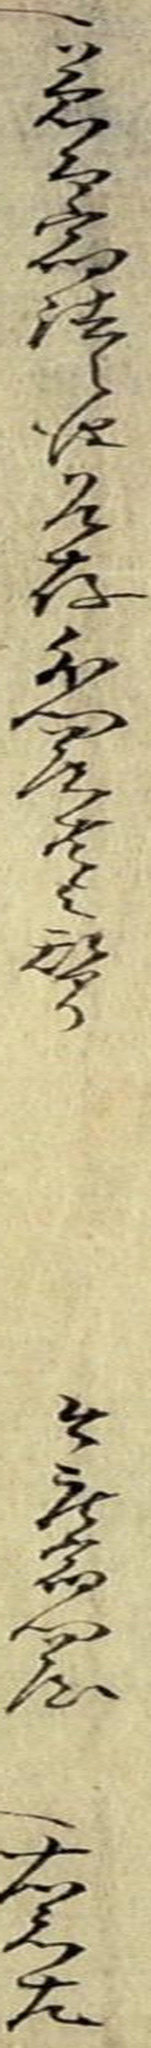兼而宿法之儀乍存外問屋共と替り今庄宿問屋
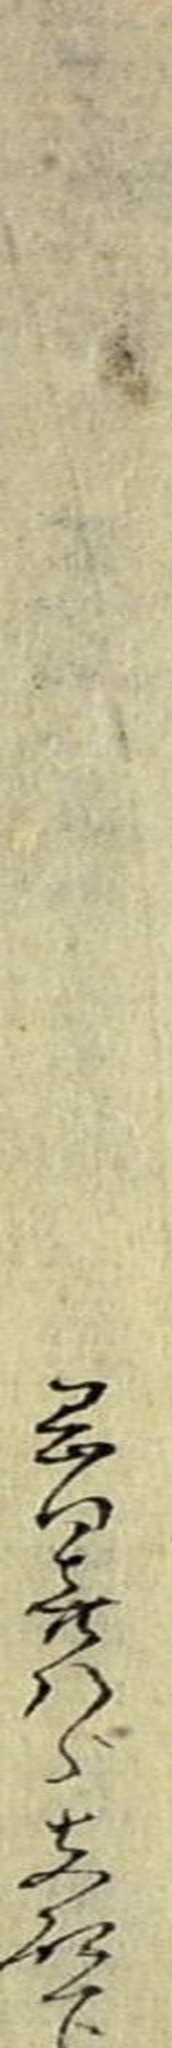岡田喜八郎支配下
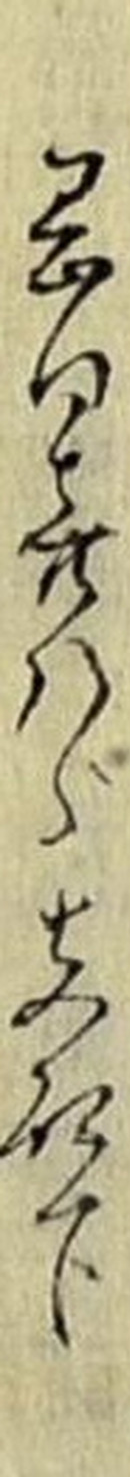岡田喜八郎支配下
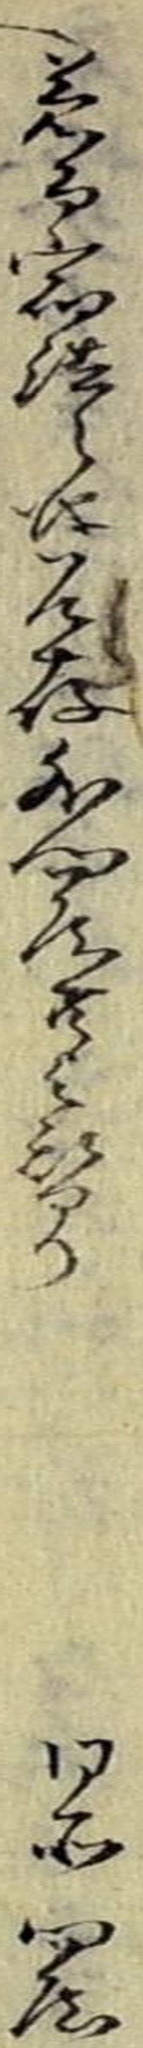兼而宿法之儀乍存外問屋共と替り同所問屋
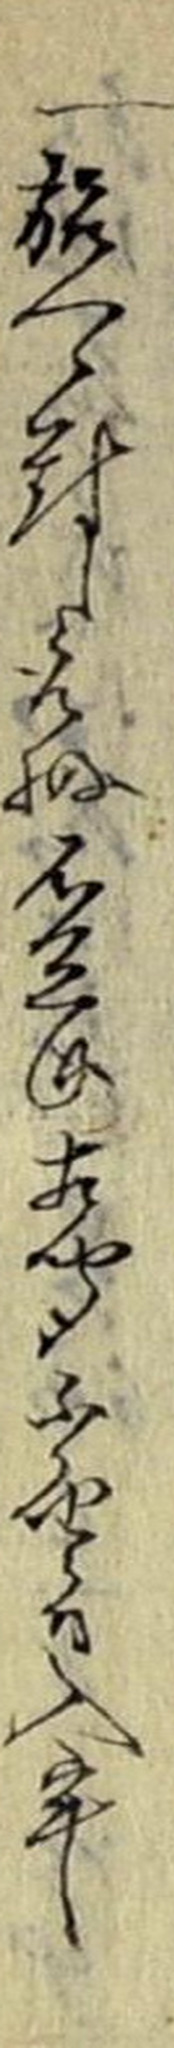旅人へ対し取扱不宜趣相聞不届に付入牢弥左衛門
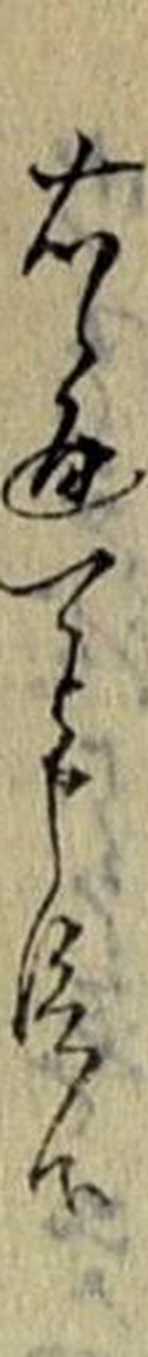右之通可被申渡候
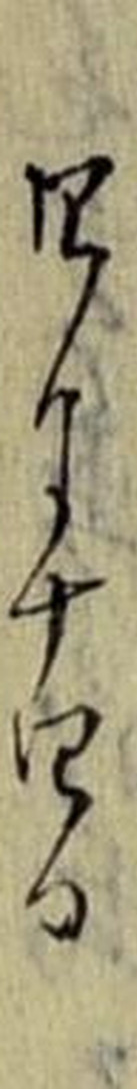四月十四日
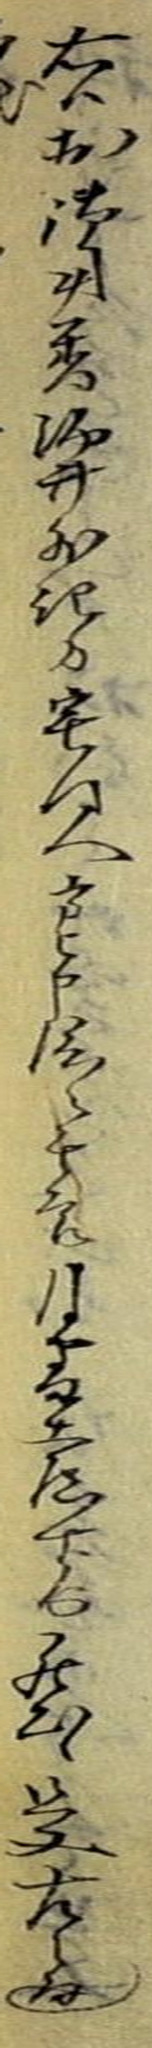右は於御用番酒井外記方宅同人方被申渡候其節月番土屋十郎右衛門罷出候且又左之通
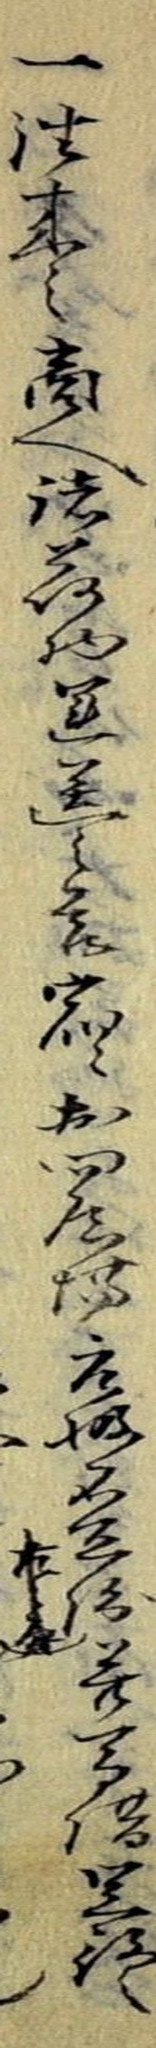一往来之商人諸荷物運送之節宿々於問屋場取扱不宜儀并馬借足役之
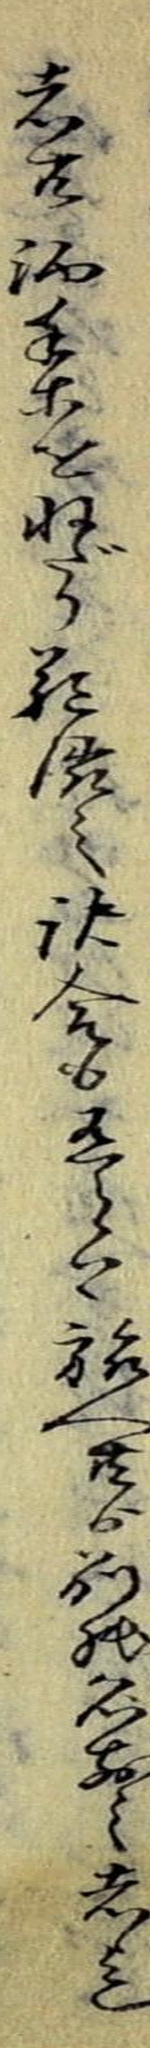者共酒手等をねだり難渋之訳合も有之候はヽ旅人共ゟ別紙名前之者迄
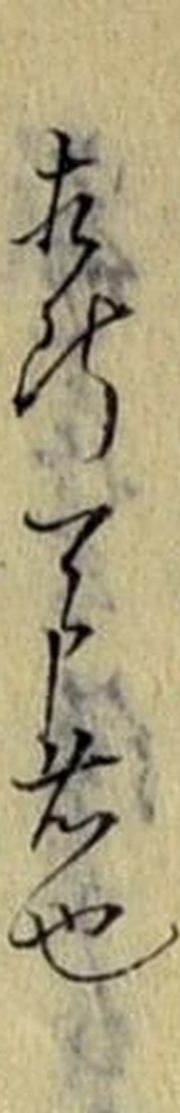相断可申者也
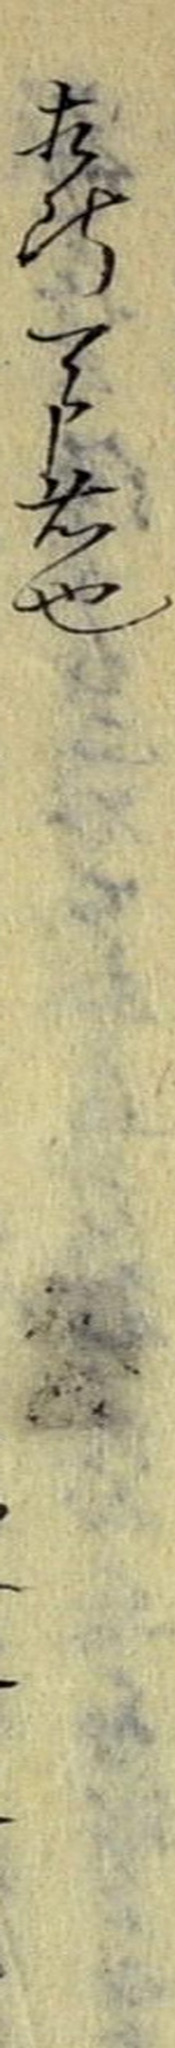相断可申者也
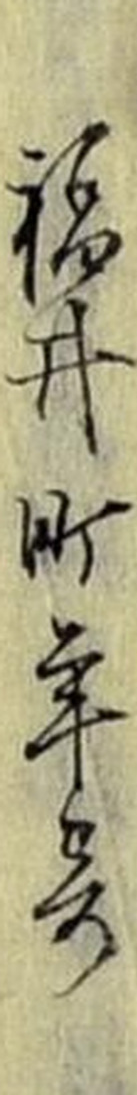福井町年寄
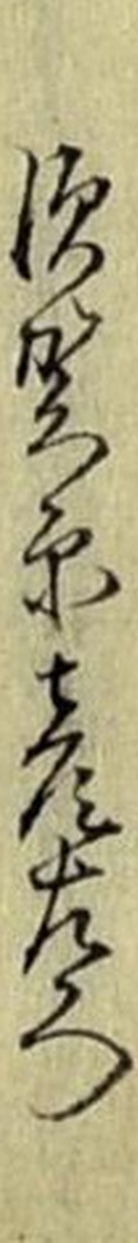須賀原彦左衛門
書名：命令之部 六
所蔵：福井県文書館 Fukui Prefectural Archives
